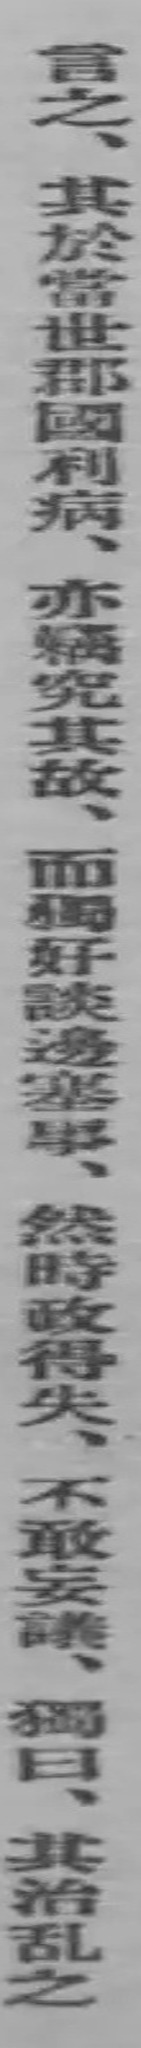言之、其於当世郡国利病、亦藕究其故、而独好談邊塞事、然時政得失、不敢妄議、独曰、其治乱之
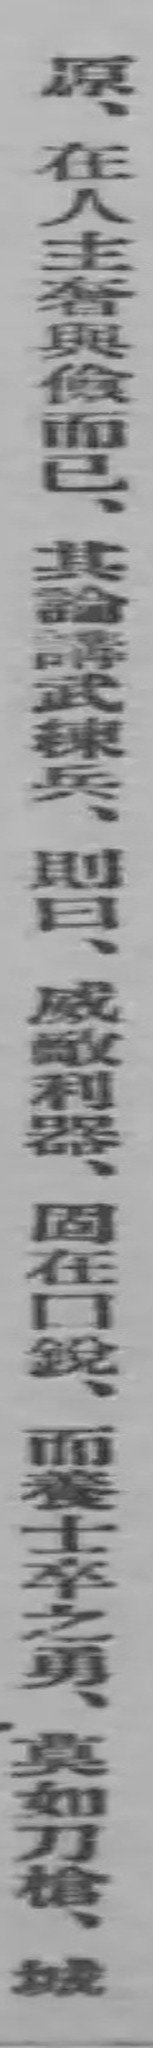原、在人主奢與倹而巳、其論議武練兵、則曰、威敵利器、固在口鋭、而養士卒之勇、莫如刀槍、城
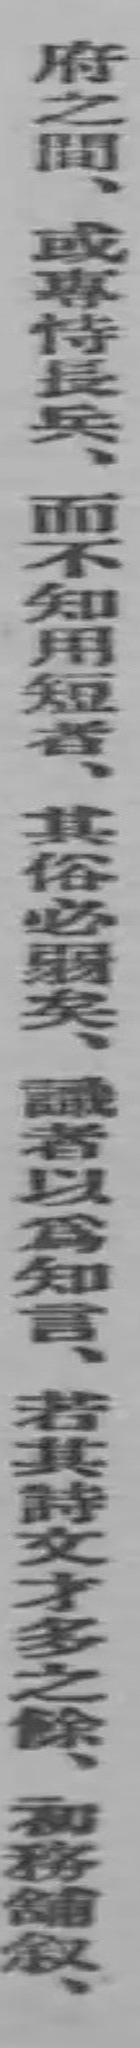府之間、或専恃長兵、而不知用短者、其俗必弱矣、識者以為知言、若其詩文才多之余、初務舖叙、
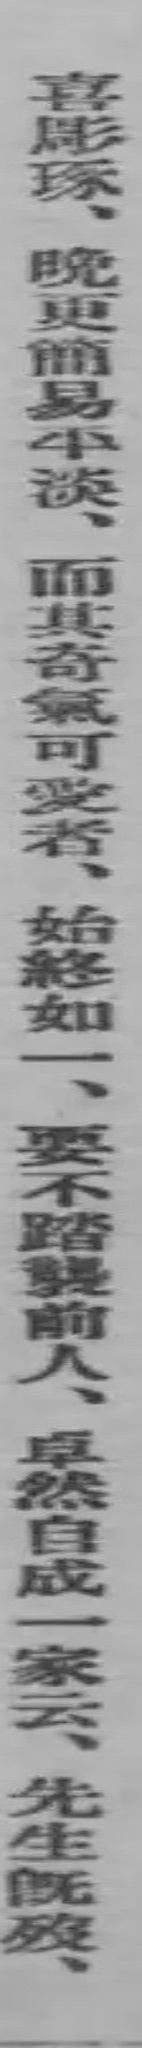喜彫琢、晩更簡易平淡、而其奇気可愛者、始終如一、要不踏襲前人、卓然自成一家伝、先生既歿、
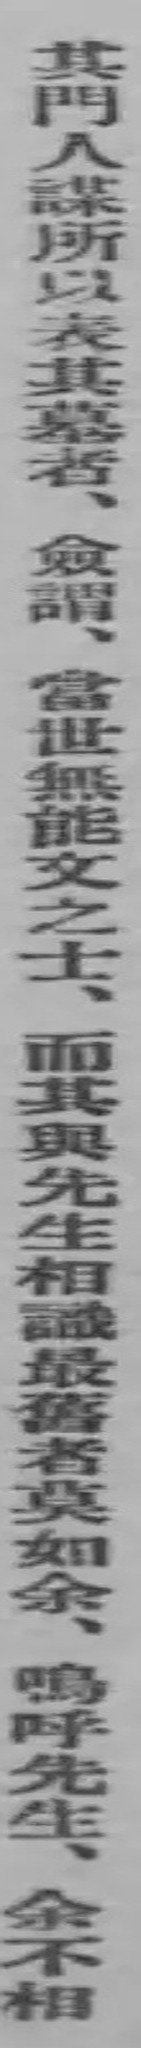其門人謀所以表其墓者、僉謂、当世無能文之士、而其與先生相識最旧者莫如余、嗚呼先生、余不相
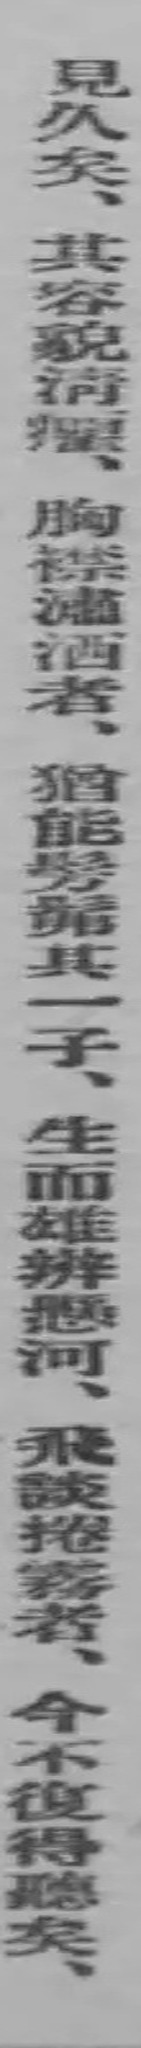見久矣、其容貌清爟、胸襟潚洒者、猶能髣髴其一子、生而雄弁懸河、飛談捲霧者、今不復得聴矣、
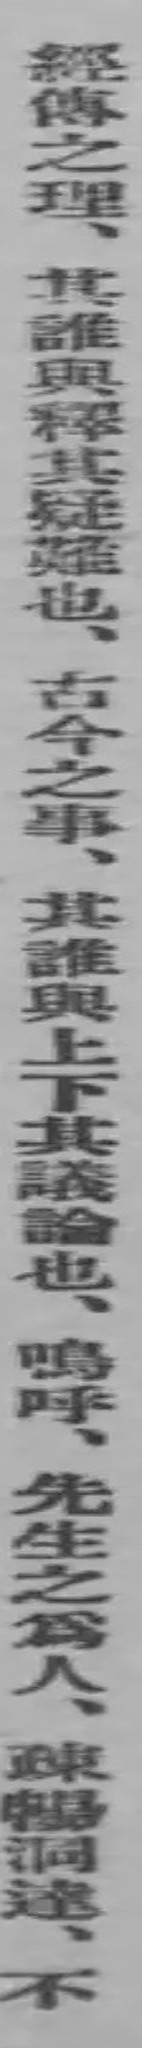経伝之理、其誰與釋其疑難也、古今之事、其誰與上下其議論也、嗚呼、先生之為人、疎暢洞達、不
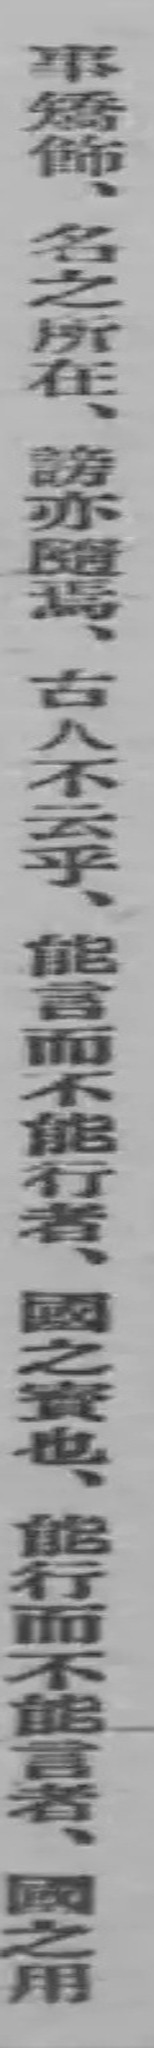事矯飾、名之所在、謗亦随焉、古人不云乎、能言而不能行者、国之宝也、能行而不能言者、国之用
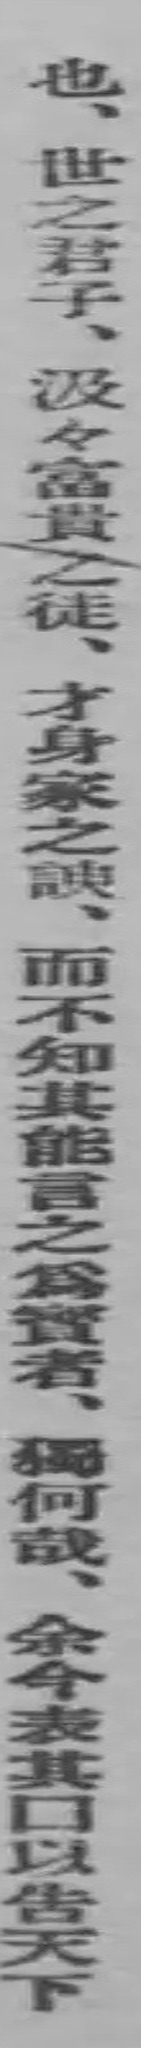也、世之君子、汲々富貴之徒、才身家之諛、而不知其能言之為宝者、独何哉、余今表其口以告天下
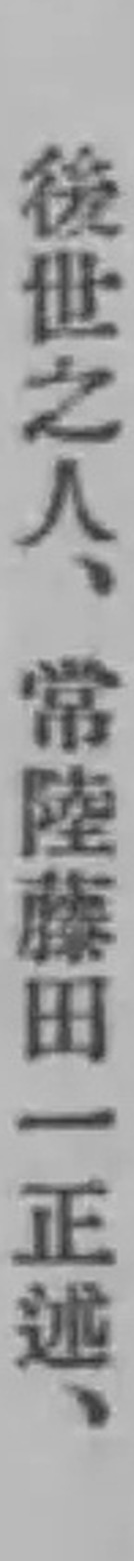後世之人、常陸藤田一正述、
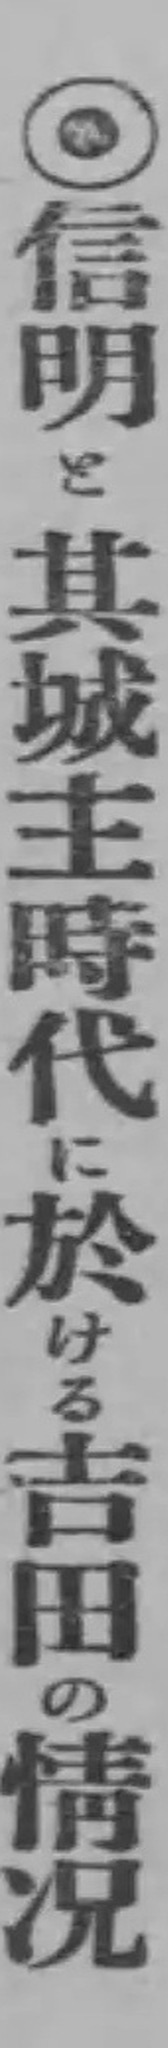⦿信明と其城主時代に於ける吉田の情況
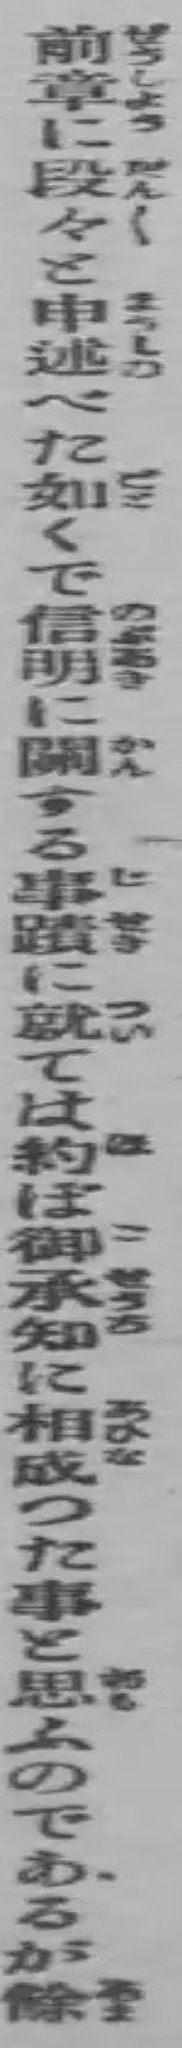前章に段々と申述べた如くで信明に関する事蹟に就ては約ぼ御承知に相成つた事と思ふのであるが余
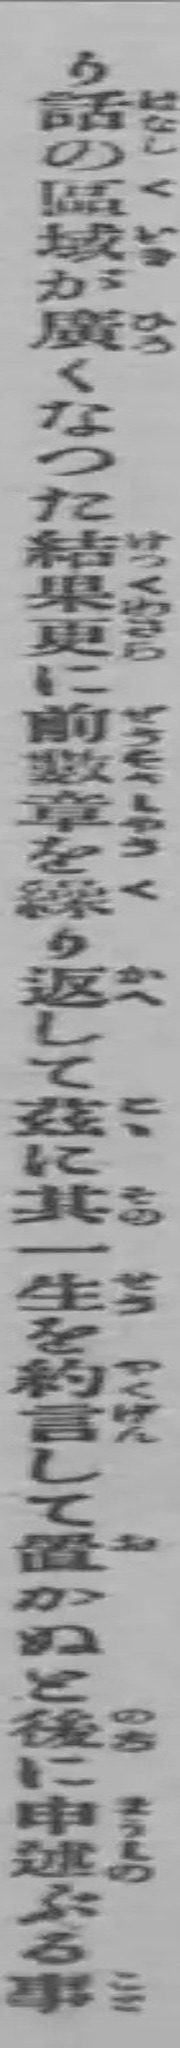り話の区域が広くなつた結果更に前数章を繰り返して茲に其一生を約言して置かぬと後に申述ぶる事
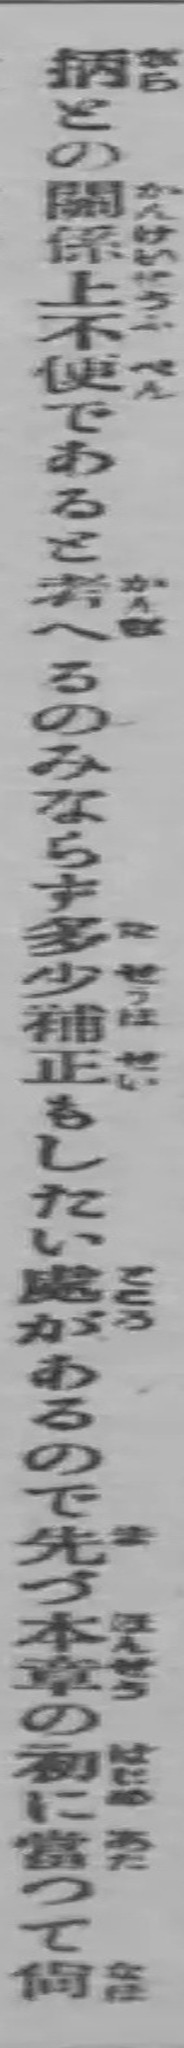柄との関係上不便であると考へるのみならず多少補正もしたい処があるので先づ本章の初に当つて尚
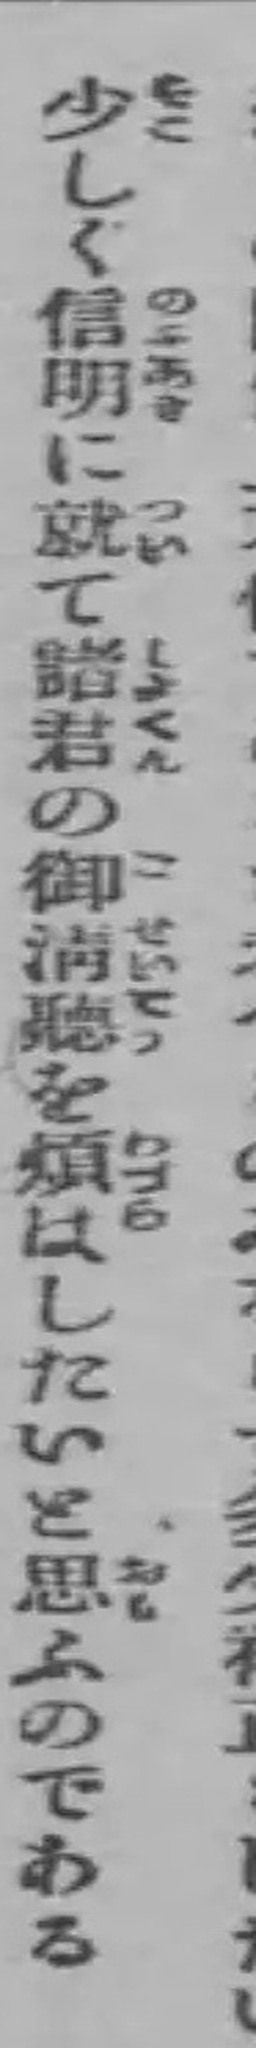少しく信明に就て諸君の御清聴を煩はしたいと思ふのである
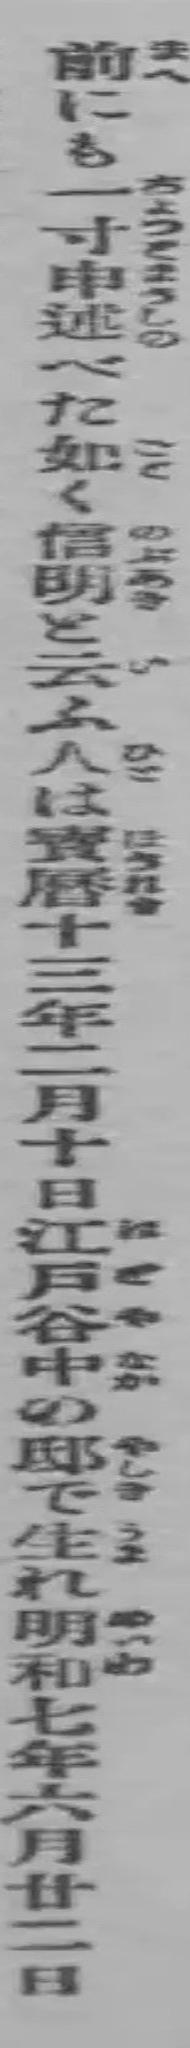前にも一寸申述べた如く信明と云ふ人は宝暦十三年二月十日江戸谷中の邸で生れ明和七年六月廿二日
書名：豊橋市史談
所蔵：国立国会図書館 National Diet Library, JAPAN
